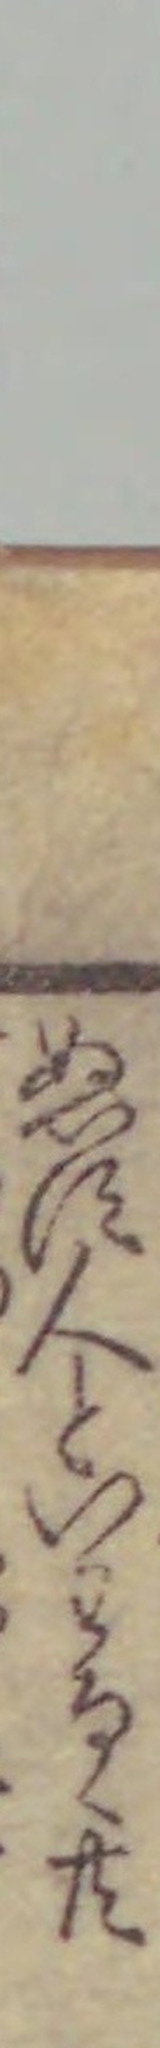ぬす人といわるゝ共
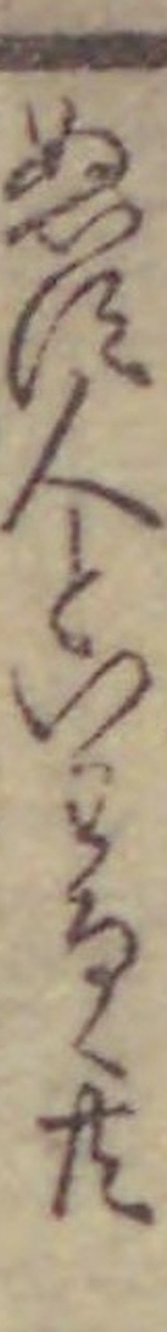ぬす人といわるゝ共
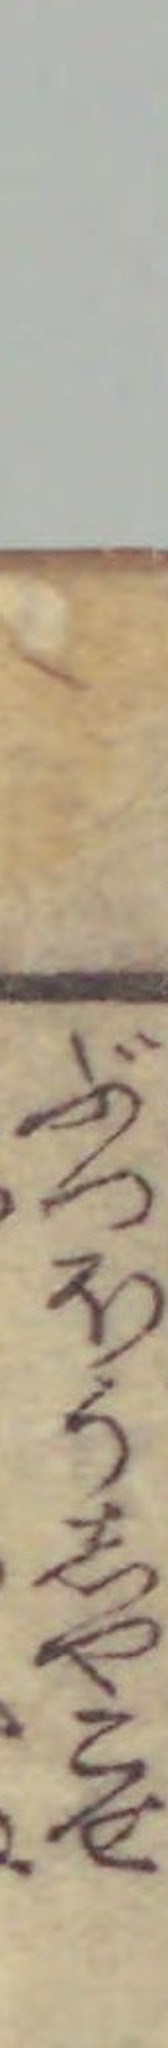ぶつほうしやこせ
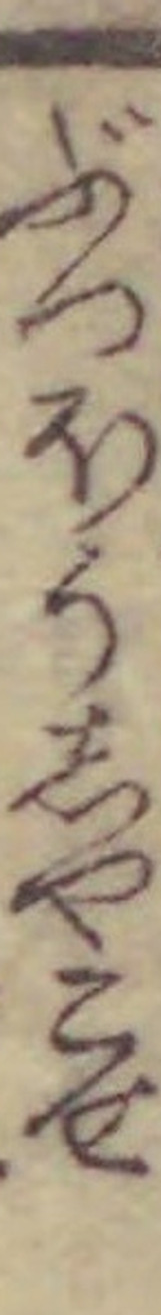ぶつほうしやこせ
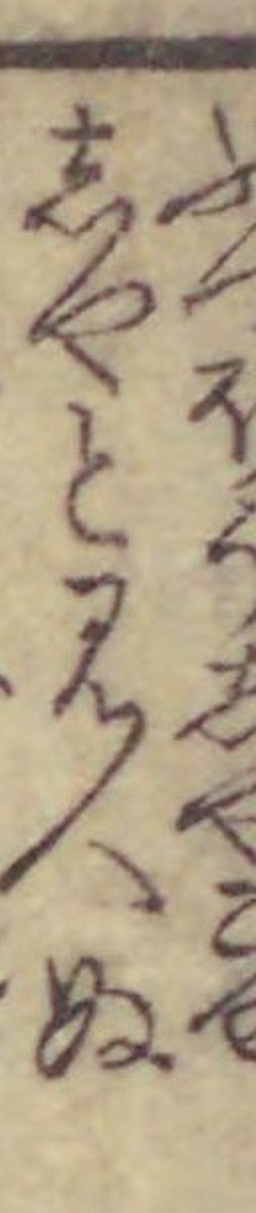しやと見へぬ
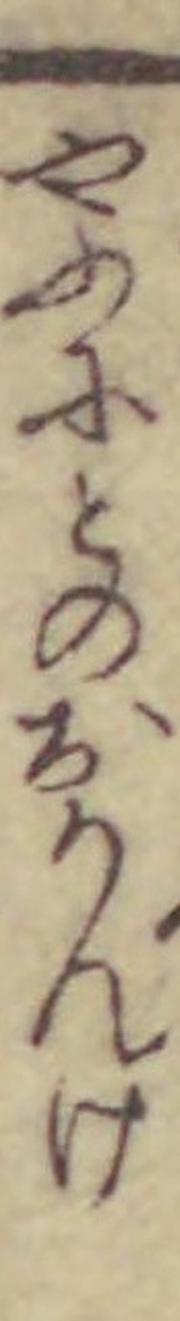やふにとのおかんけ
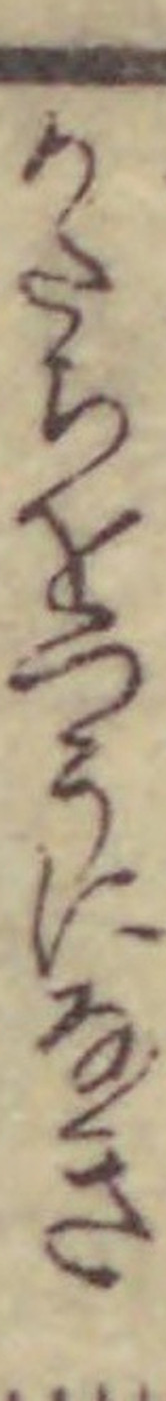かたちをつうになき
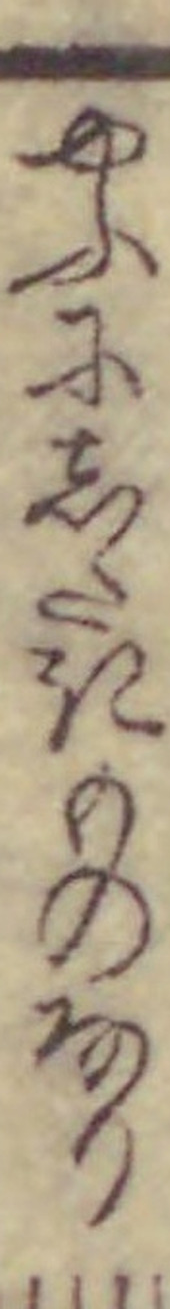やふにしたきものなり
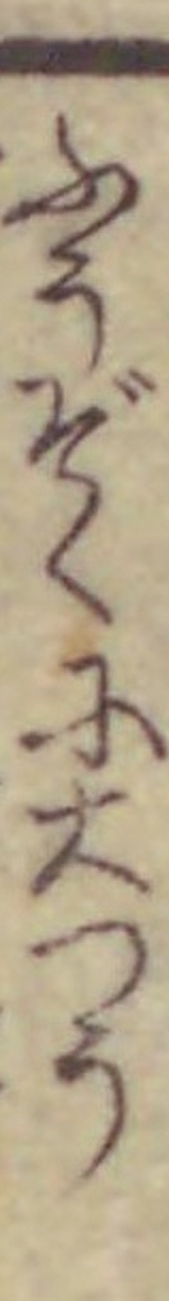ふうぞくに大つう
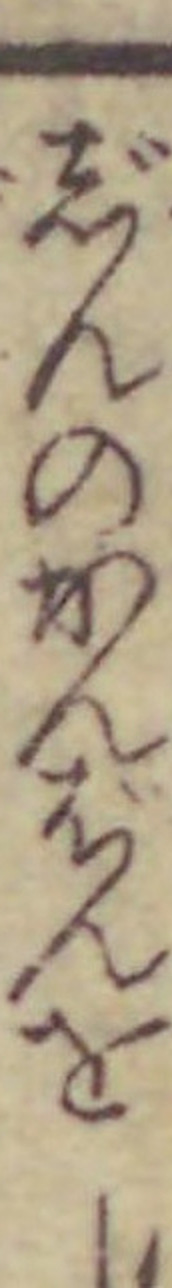じんのかんばんを
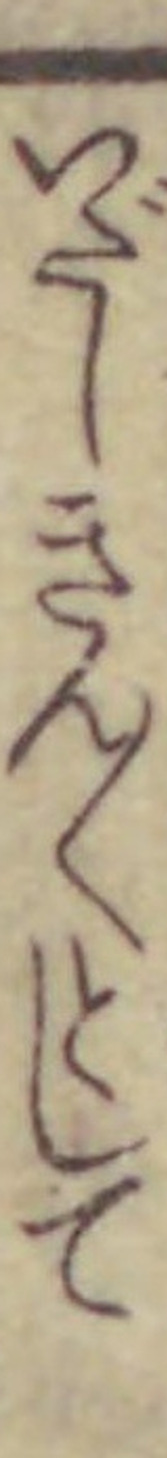いだしきん〳〵として
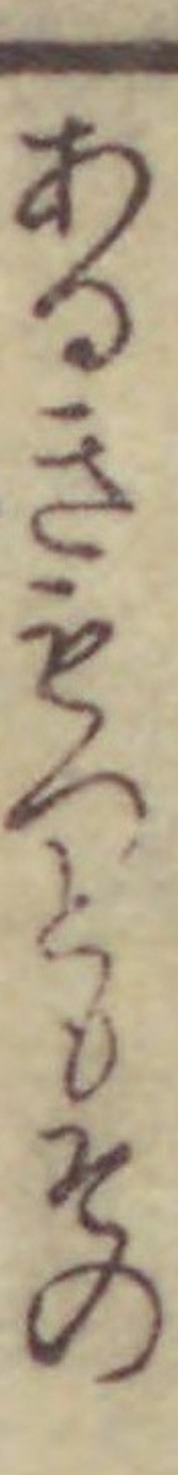あるきもつともその
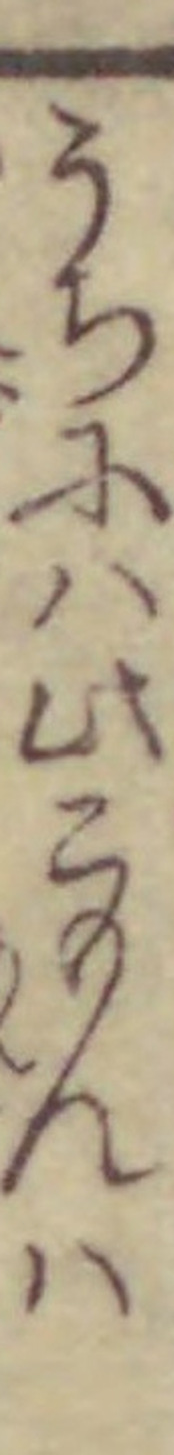うちには此こもんは
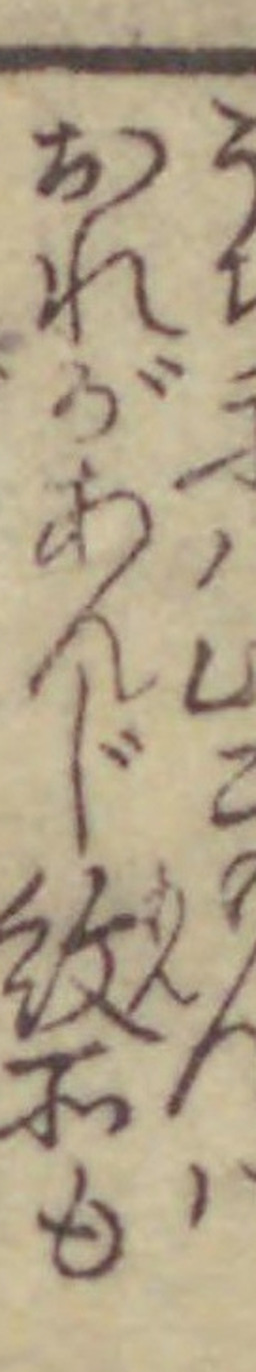おれがあんじ紋所も
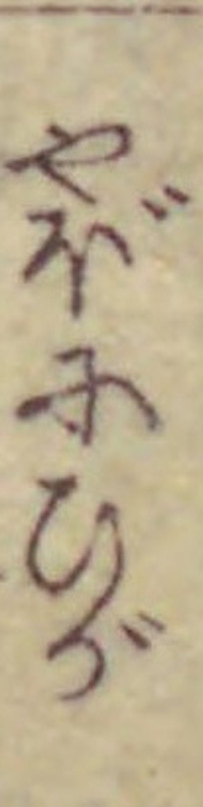やぼにひが
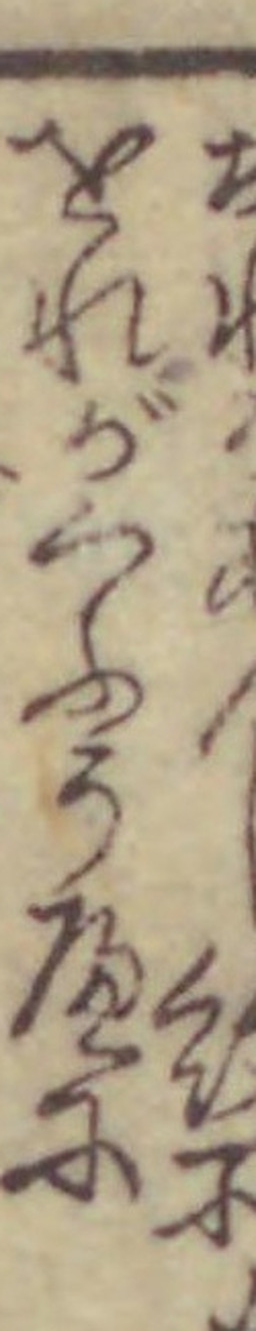をれがくふうへに
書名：大通人穴[サガシ] 3巻
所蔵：国立国会図書館 National Diet Library, JAPAN
